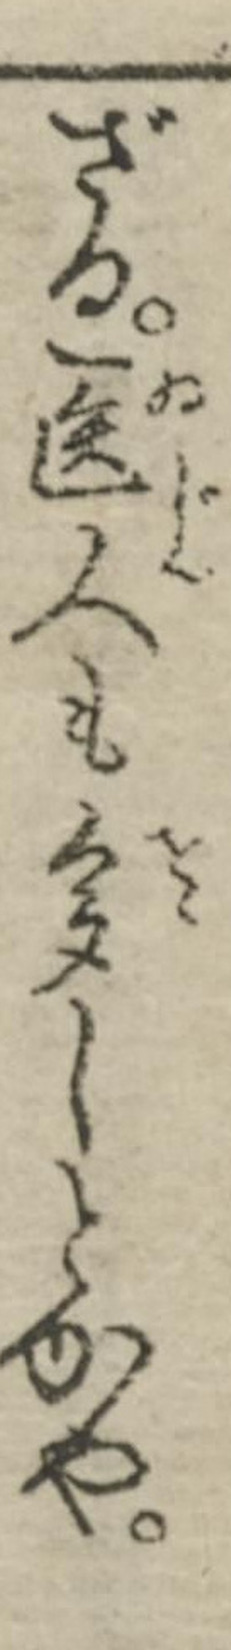ざる。医人も多しとかや。
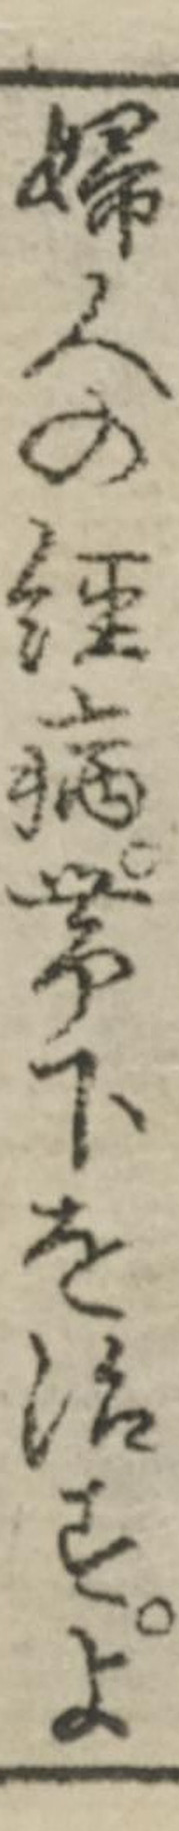婦人の経病。帯下を治す。よ
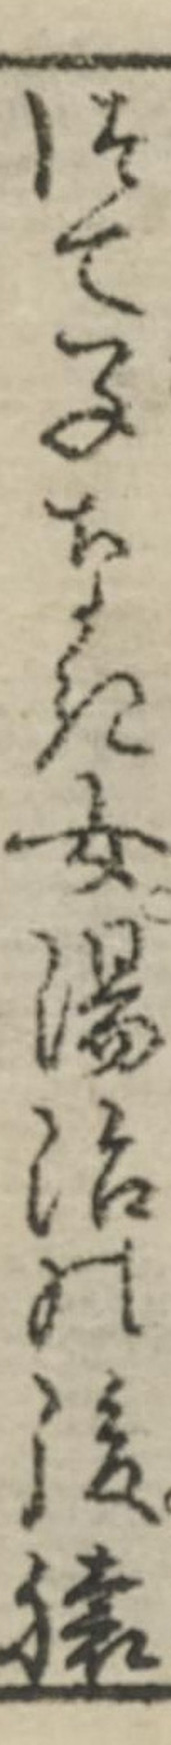つて子なき女。湯治の後。懐
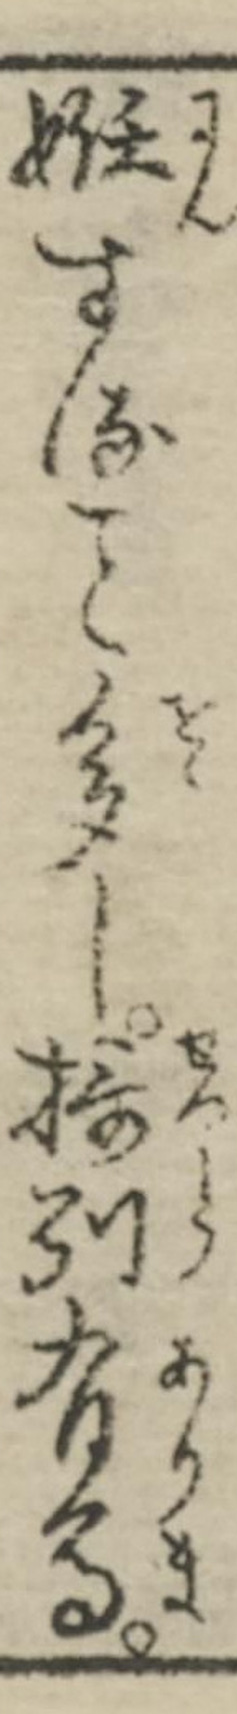妊すること多し。攝州有馬。
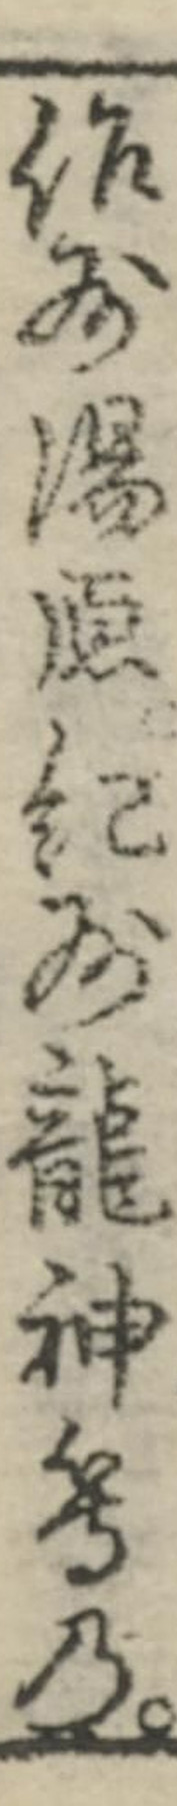作州湯原。紀州龍神等の。
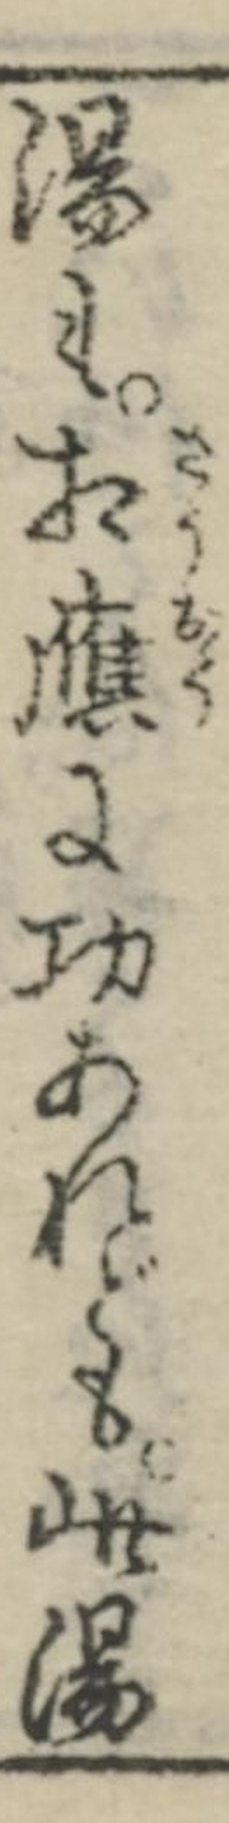湯も。相応に功あれども。此湯
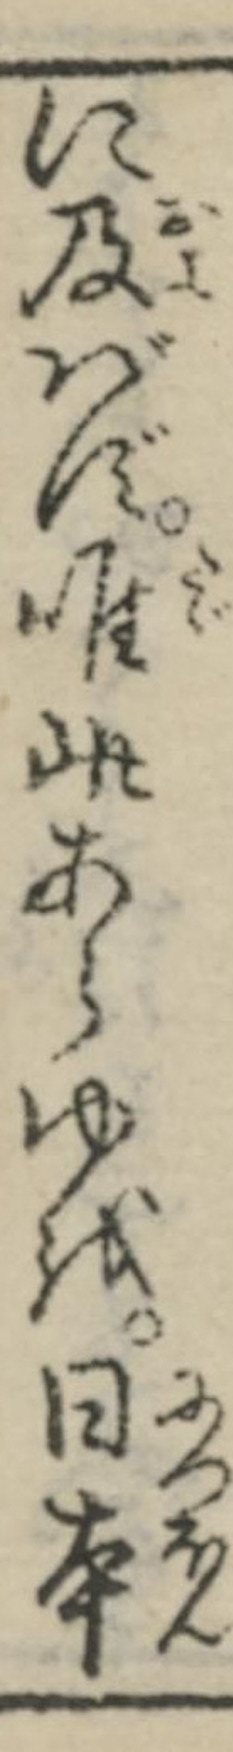に及ばず。唯此あらゆを。日本
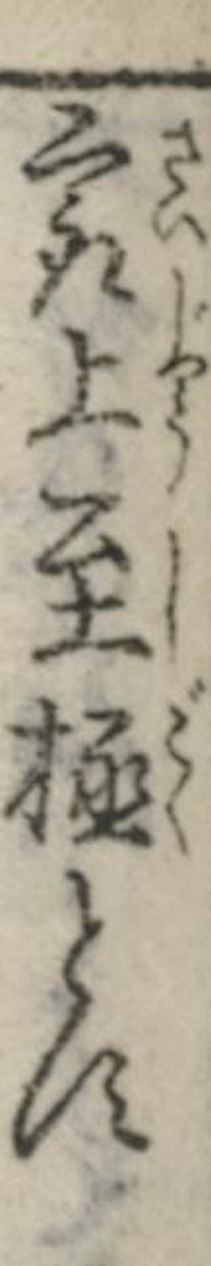最上至極とす
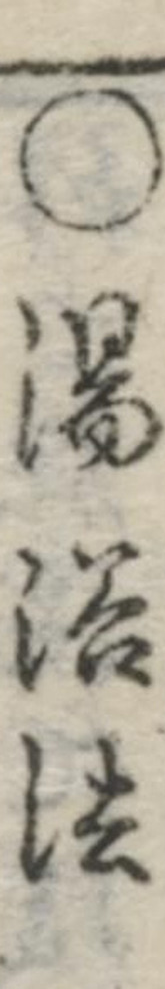○湯浴法
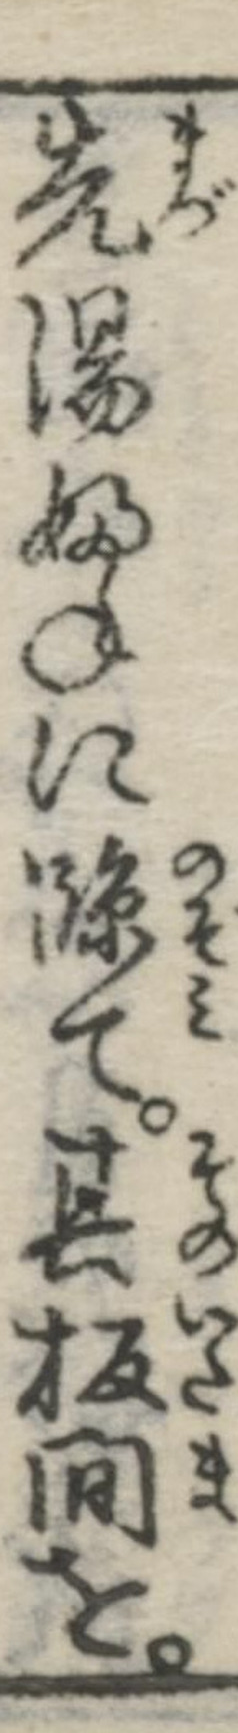先湯ふねに臨て。其板間を。
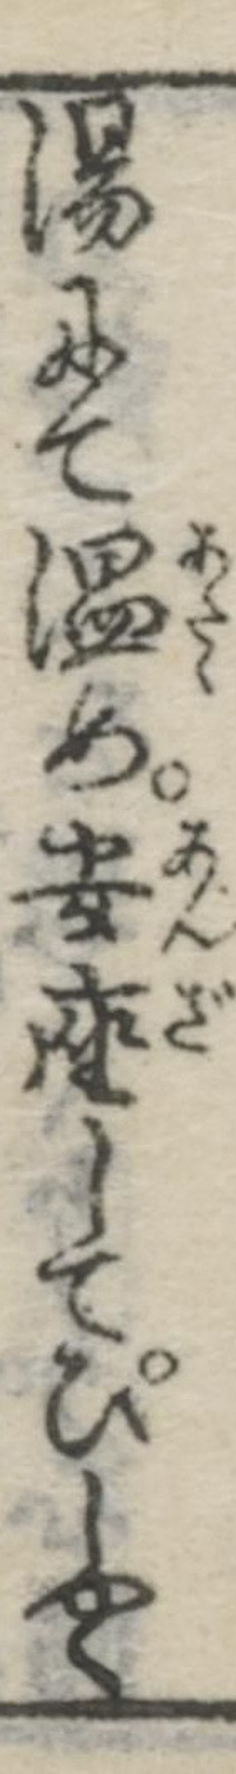湯にて温め。安座して。ひしやく
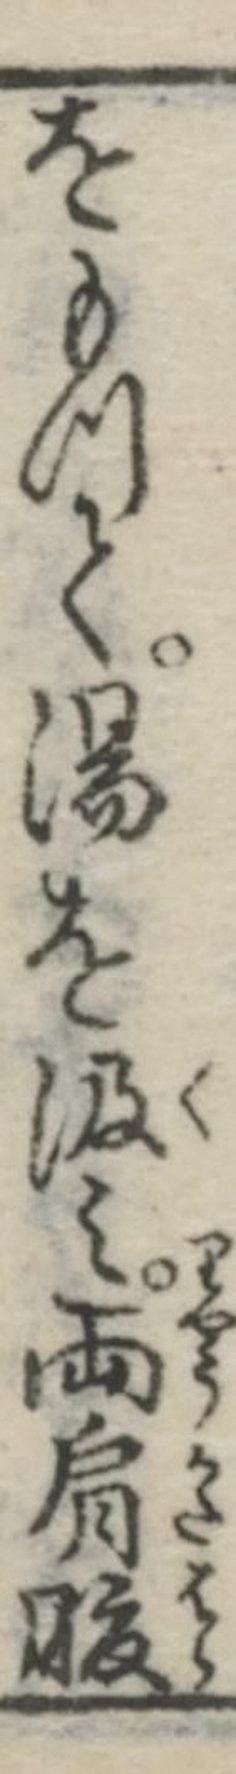をもつて。湯を汲み。両肩腹
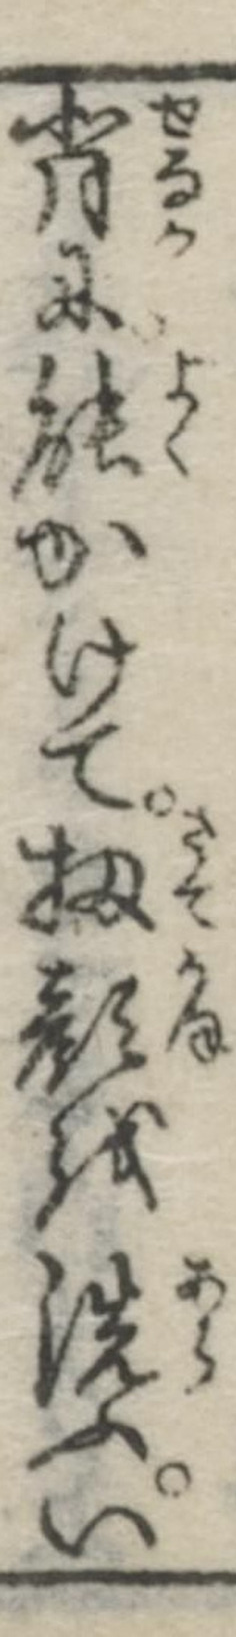背に能かけて。扨顔を洗ふ。い
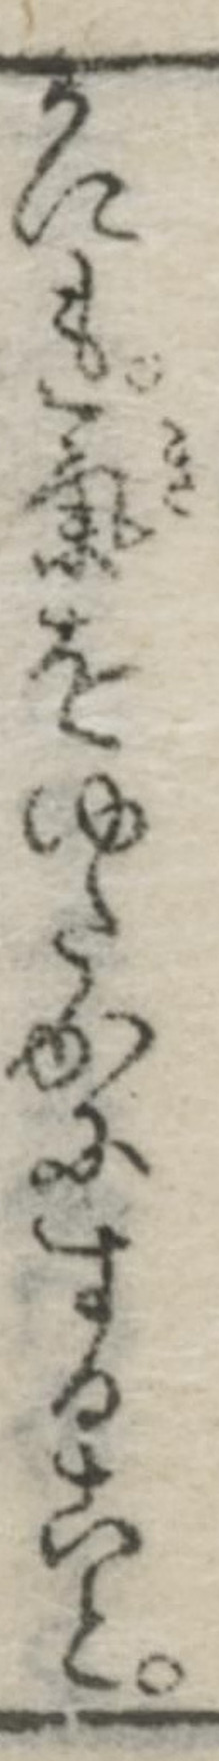かにも。気をゆたかにすること。
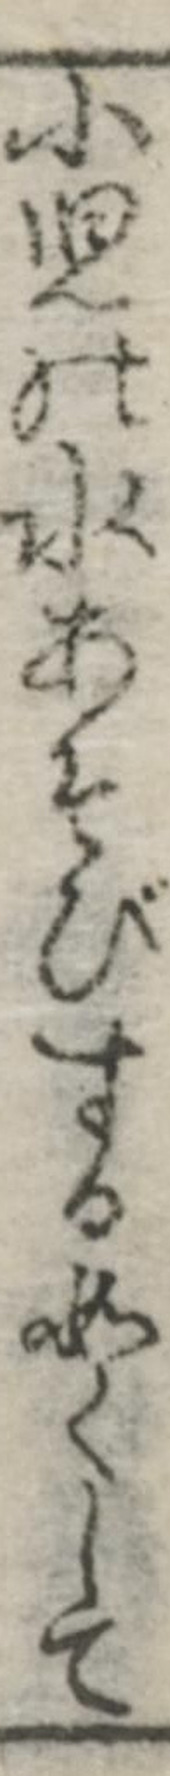小児の水あそびする如くして
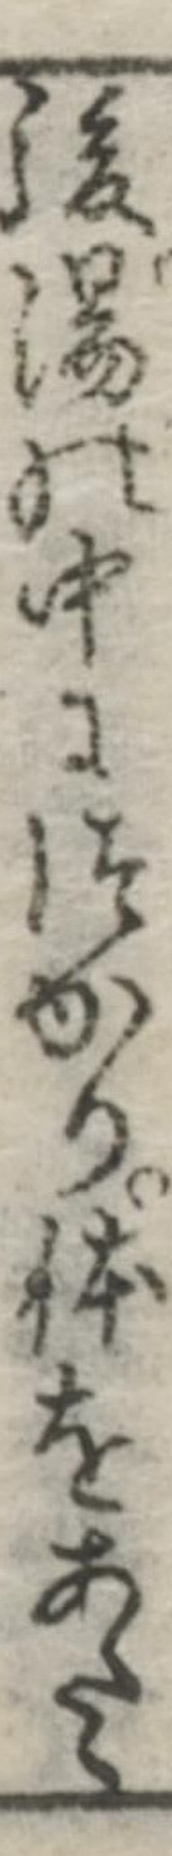後。湯の中につかり。体をあたゝ
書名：但州城崎浴湯辧
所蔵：東京大学地震研究所図書室 Earthquake Research Institute Library, The University of Tokyo, JAPAN
